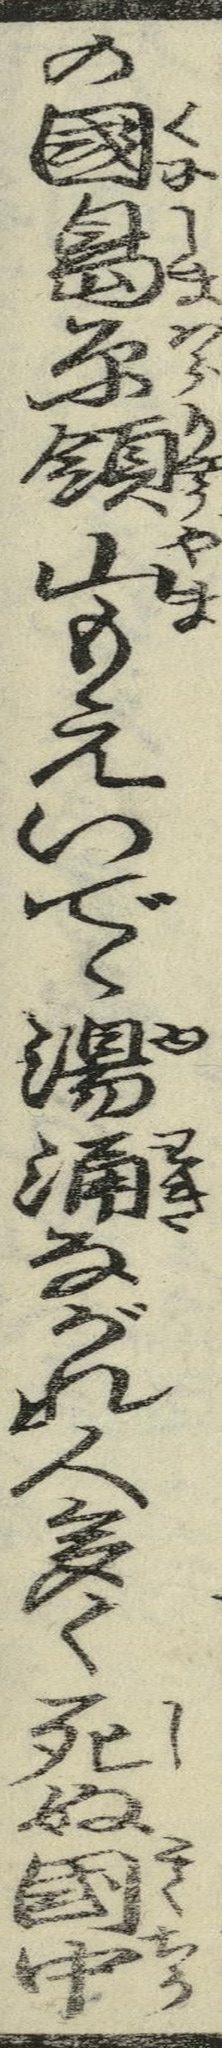の国島原領山もえいでゝ湯涌ながれ人多く死ぬ国中
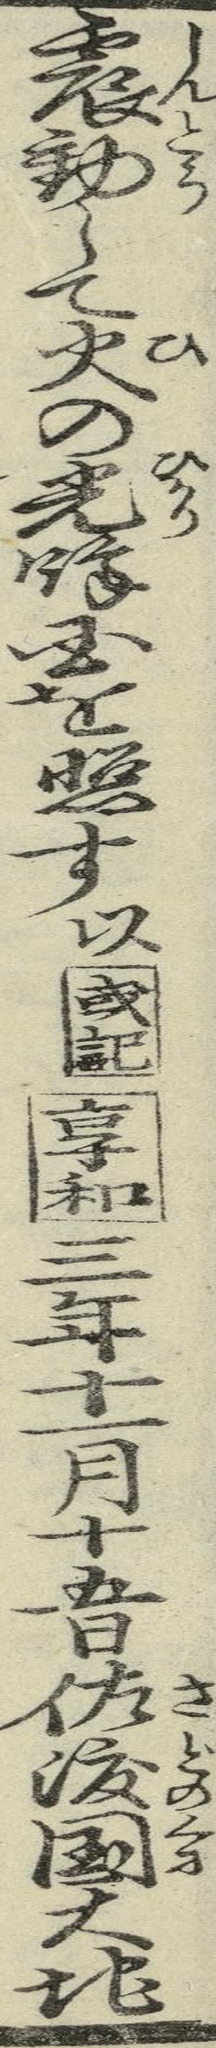震動して火の光余国を照す以或記享和三年十一月十五日佐渡国大地
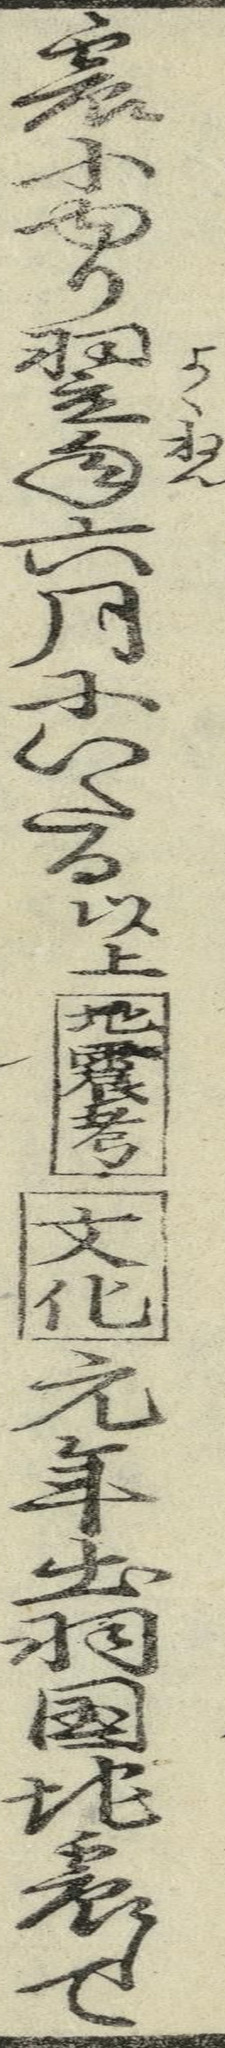震にゆり翌年六月にいたる以上地震考文化元年出羽国地震して
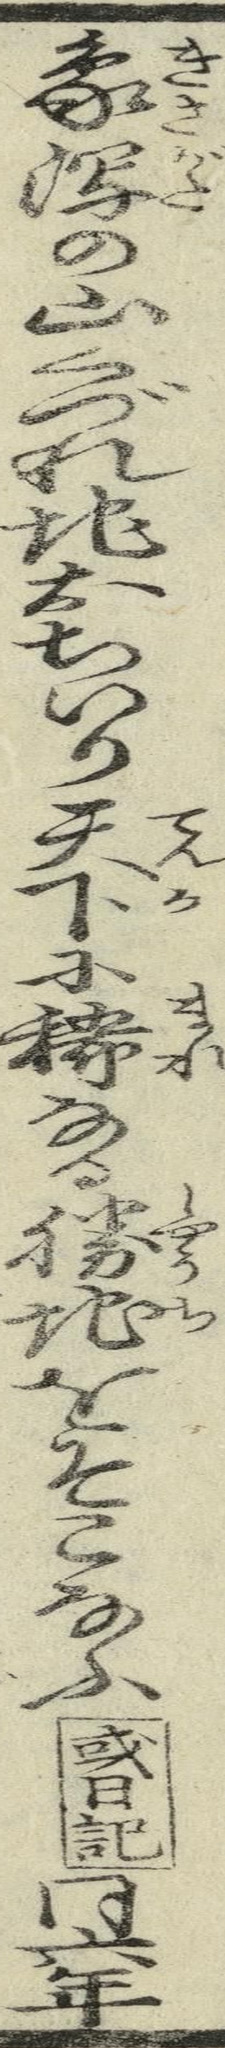象潟の山くづれ地おちいり天下に稀なる勝地をそこなふ或日記同六年
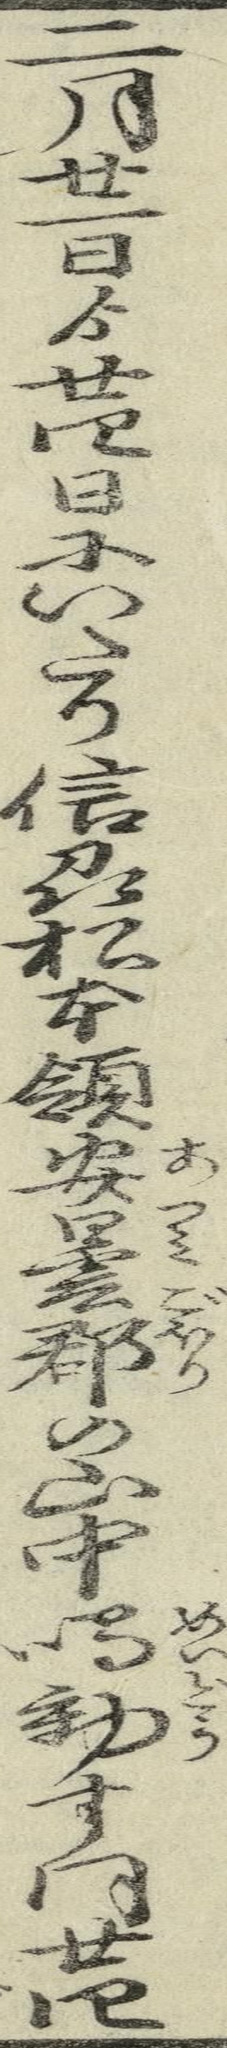二月廿一日ゟ廿四日にいたり信州松本領安曇郡の山中鳴動す同廿四
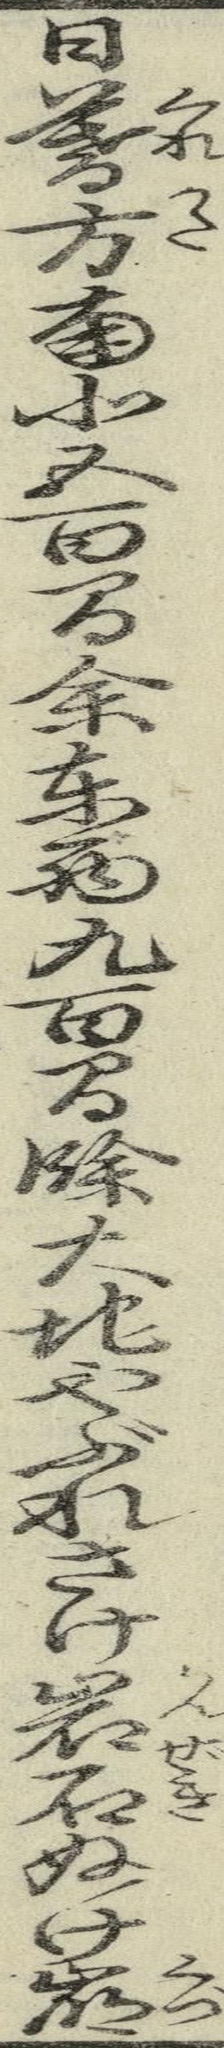日暮方南北五百間余東西九百間余大地やぶれさけ岩石ぬけ崩
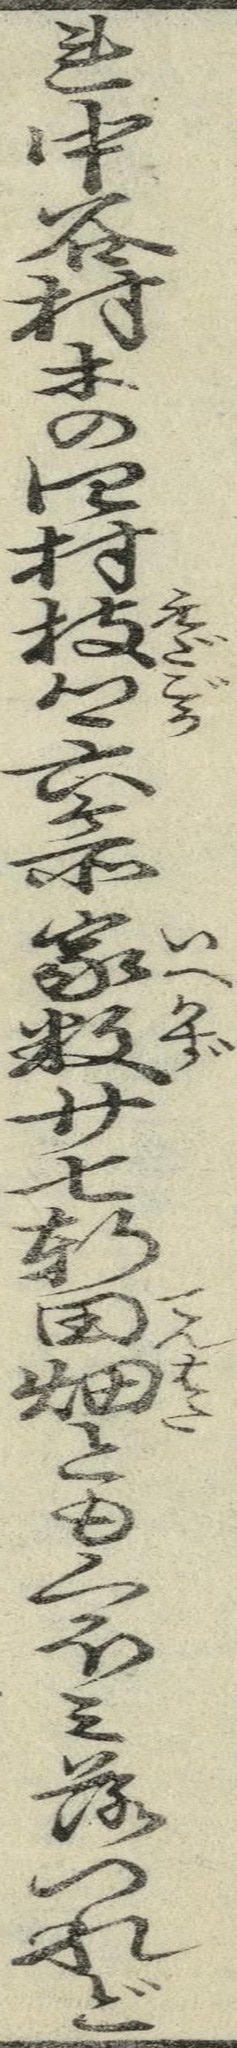れ中谷村等の四村枝郷六ケ所家数廿七軒田畑ともくほみ落つれど
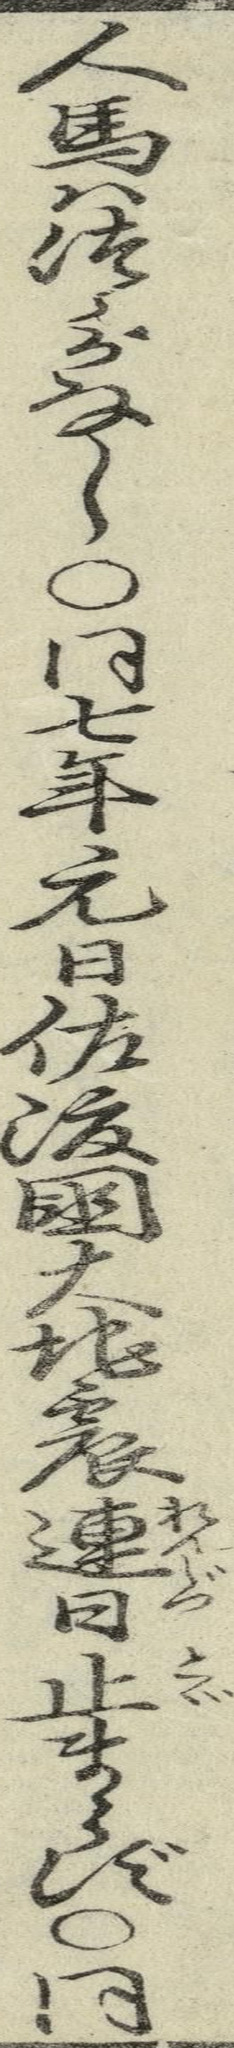人馬はつゝがなし○同七年元日佐渡国大地震連日止まらず○同
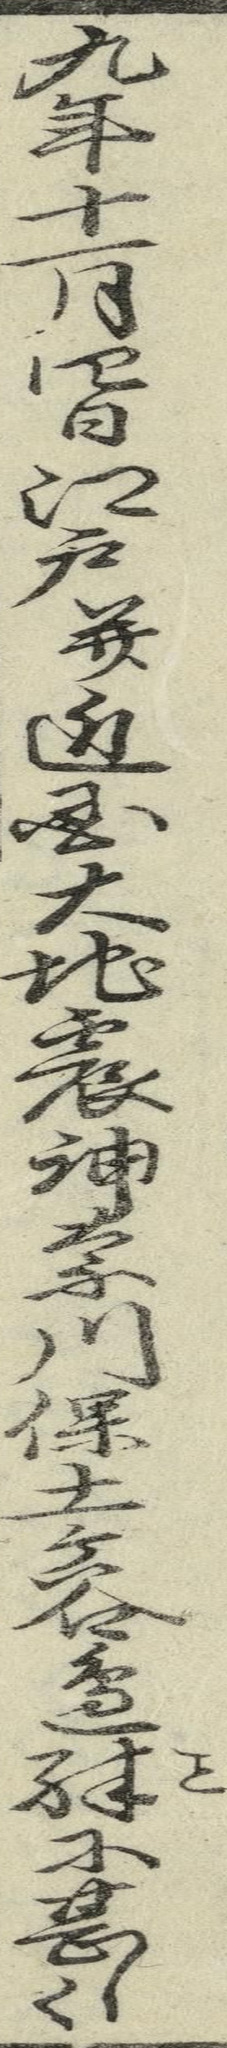九年十一月四日江戸并近国大地震神奈川保土ケ谷辺殊に甚しく
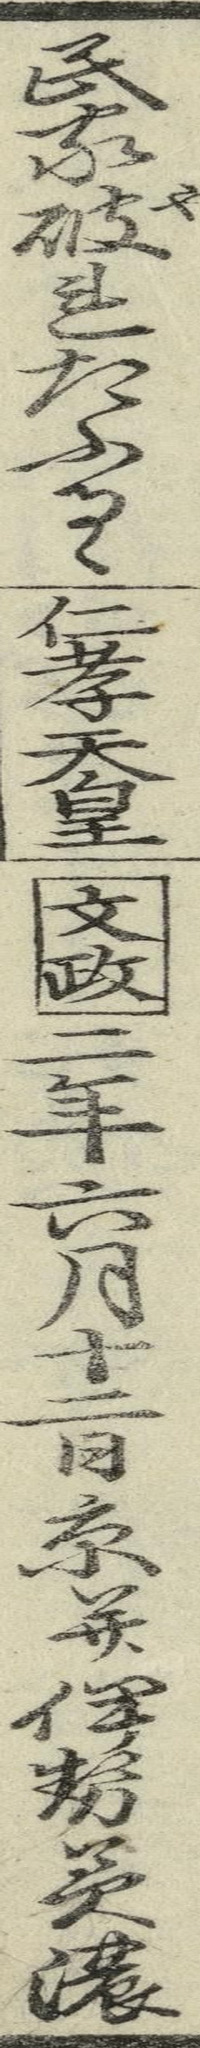民家破れたふるる仁孝天皇文政二年六月十二日京并伊勢美濃
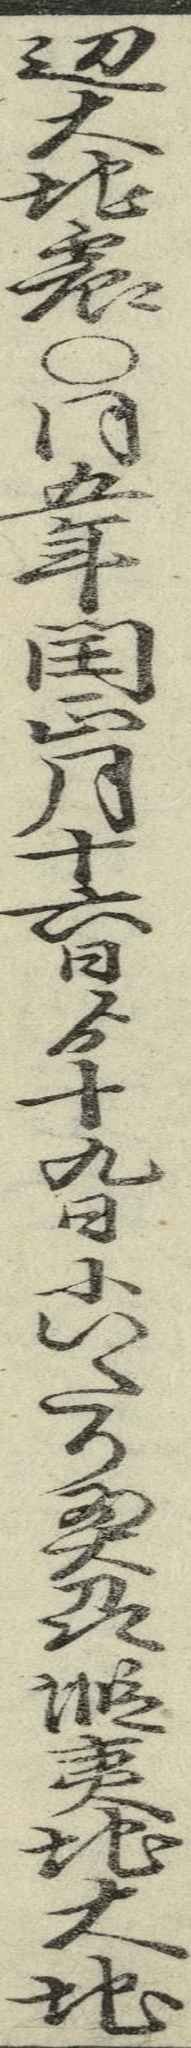辺大地震○同五年閏正月十六日ゟ十九日にいたり奥州蝦夷地大地
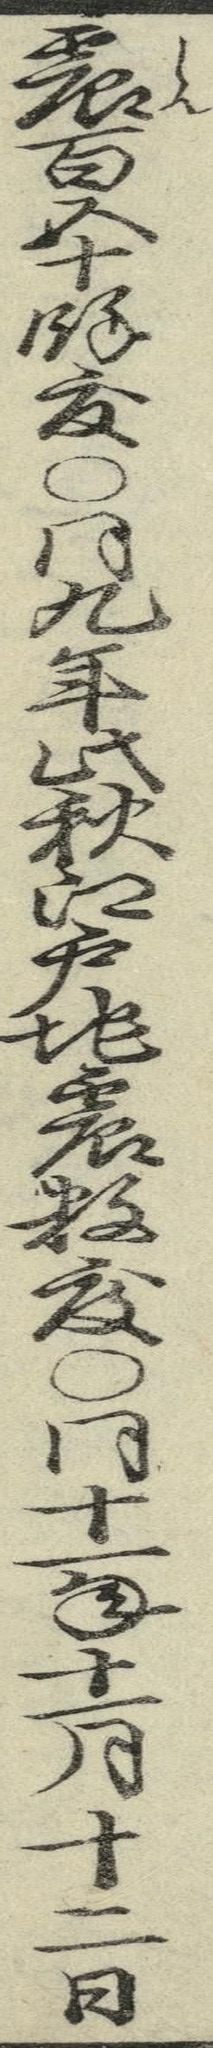震百五十余度○同九年此秋江戸地震数度○同十一年十一月十二日

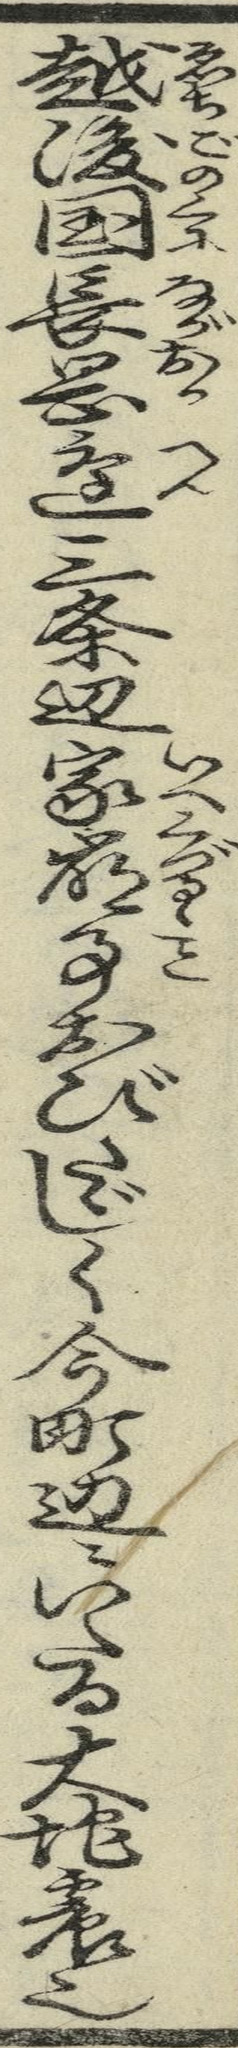越後国長岡辺三条辺家崩事おびたゞしく今町辺にいたる大地震也
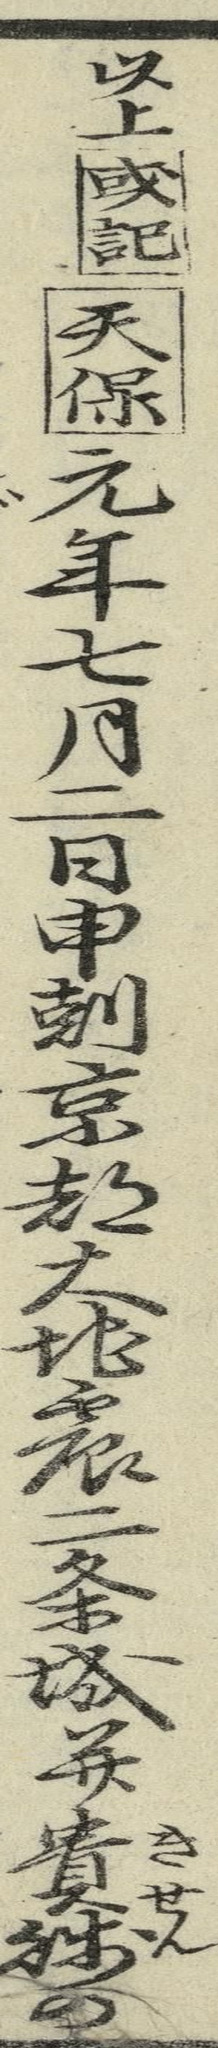以上或記天保元年七月二日申刻京都大地震二条城幷貴賤の
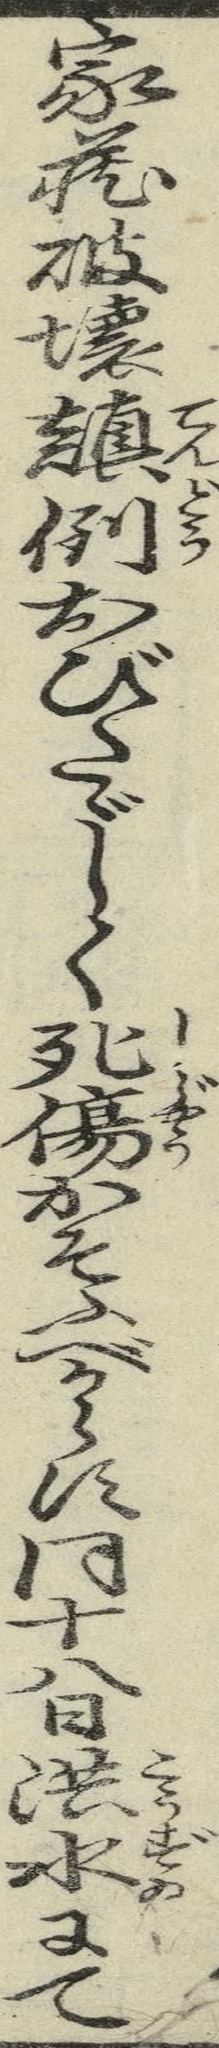家蔵破壊顛倒おびたゞしく死傷かそふべからす同十八日洪水にて
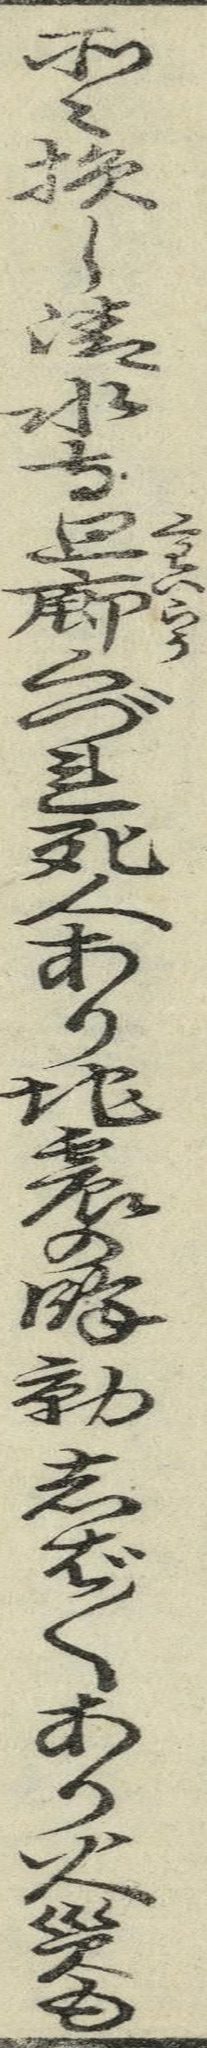所〻損し清水寺回廊くづれ死人あり地震の余動しば〳〵あり火災も
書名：地震年代記
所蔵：東京大学地震研究所図書室 Earthquake Research Institute Library, The University of Tokyo, JAPAN
